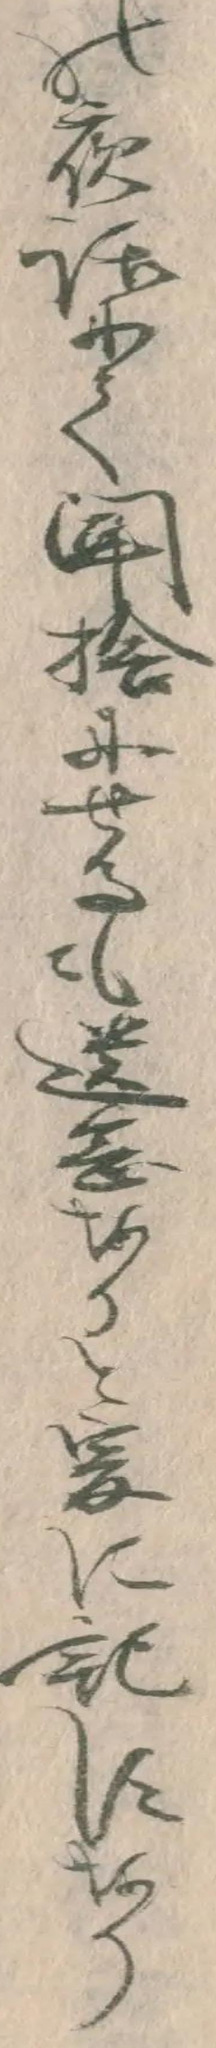の夜話にて聞捨にするも遺念なりと爰に記すなり
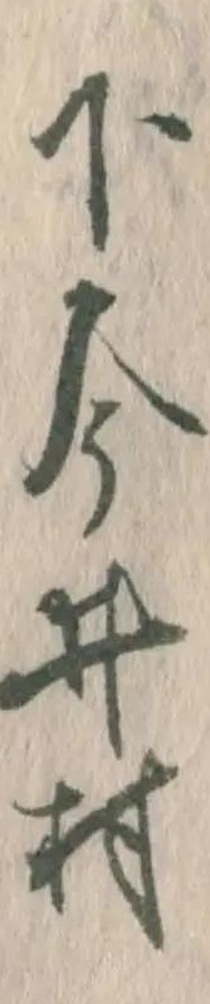下今井村
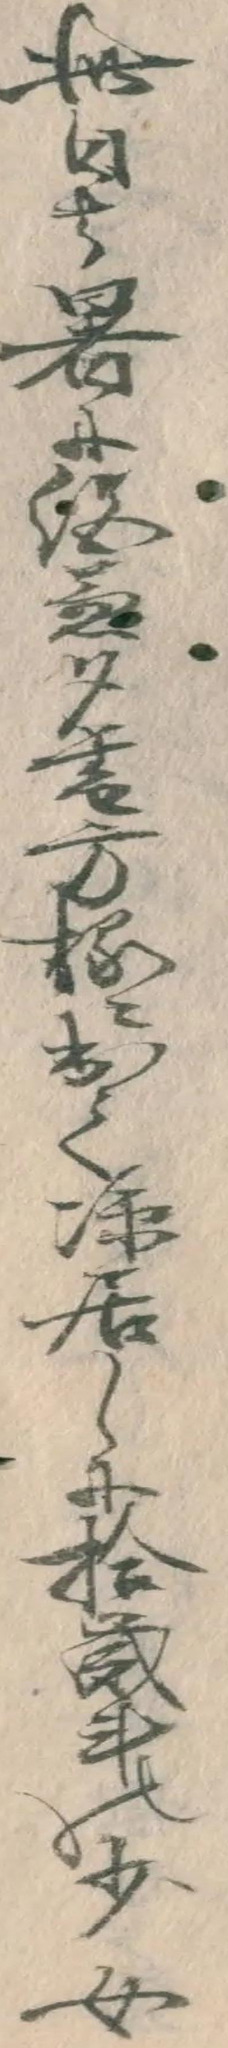此日は暑に絶兼夕暮方様に出て涼居しに拾弐斗の少女
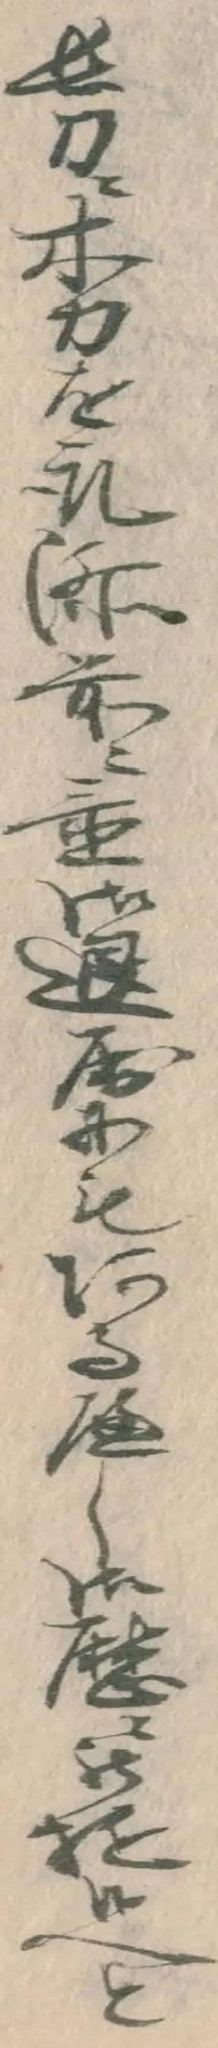長刀に木刀を取添前に置御退屈にもあるへし御慰に被遊候へと

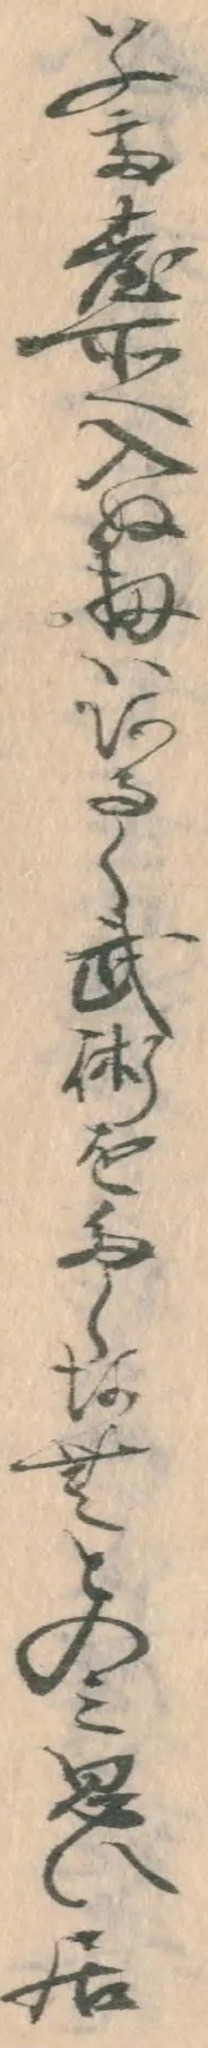いふて台所へ入ぬ扨はあるし武術をたしなむとのみ思ひ居
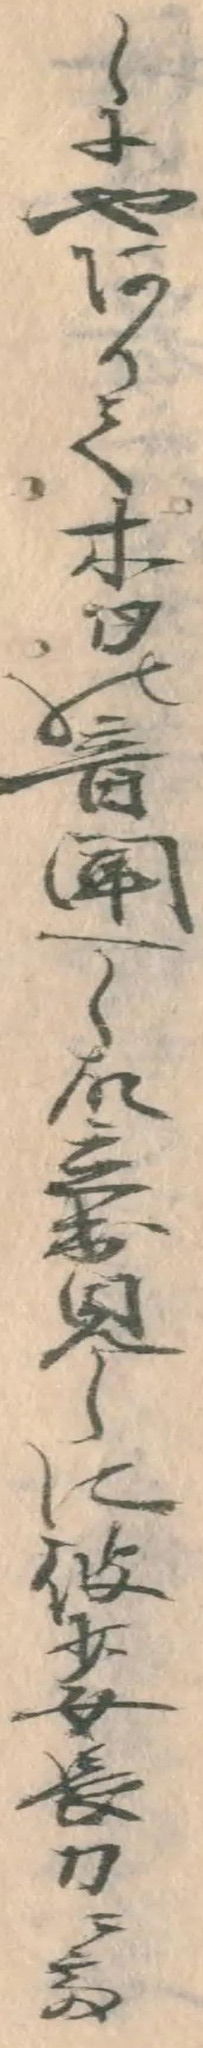しにやありて木刀の音聞へし故立出見しに彼少女長刀にて
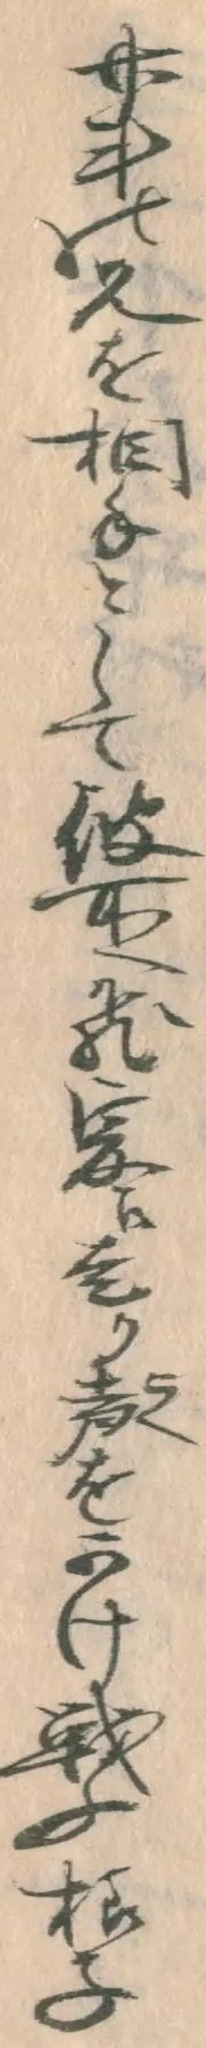廿斗の兄を相手として彼所へ飛爰え走り声かけ戦ふ様子
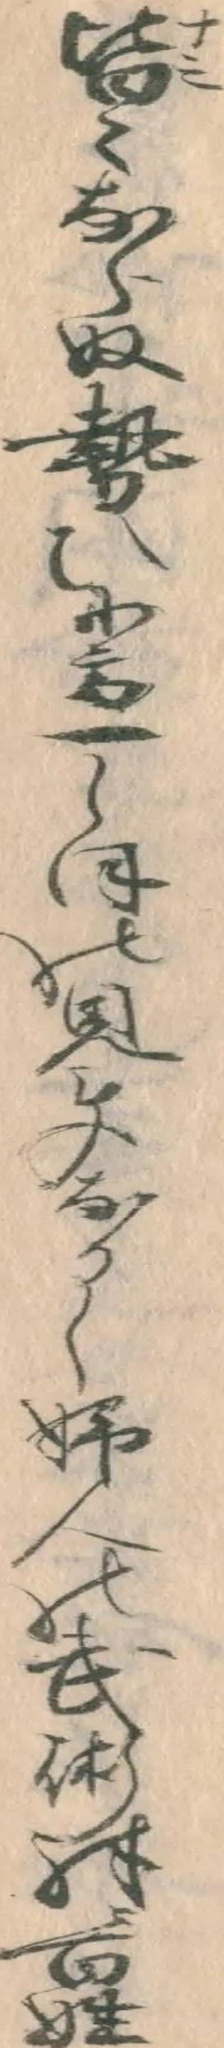皆々ならぬ勢ひにて一のほの見ものなりし婦人の武術殊に百姓
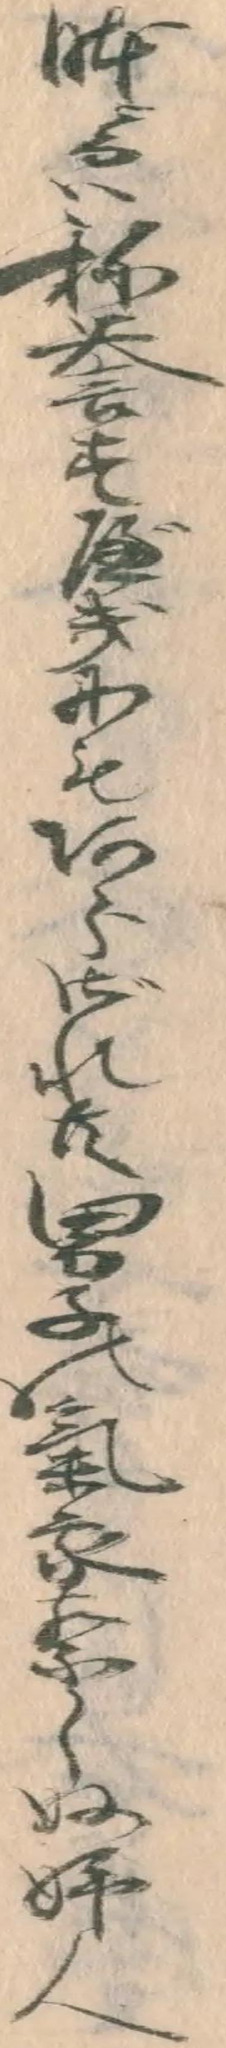体にては称誉すべきにもあらざれ共男子の気象察しぬ婦人
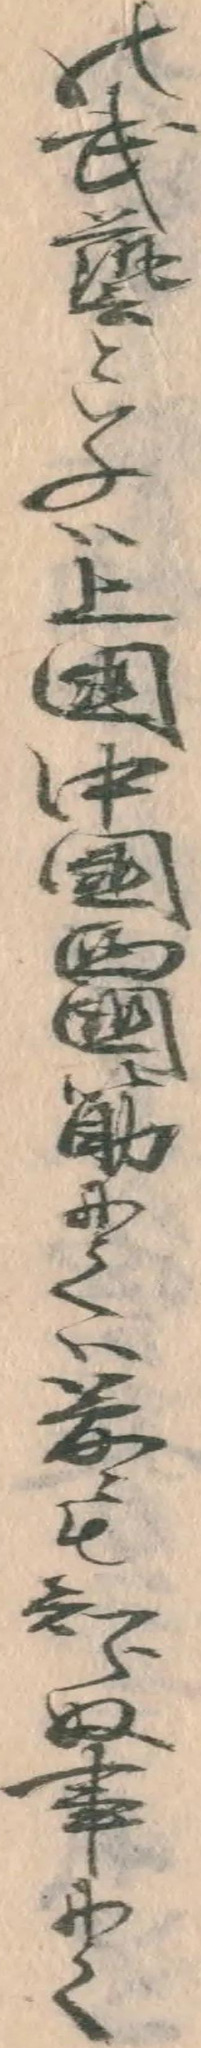の武芸といふは上国中国西国筋にては夢にも知らぬ事にて
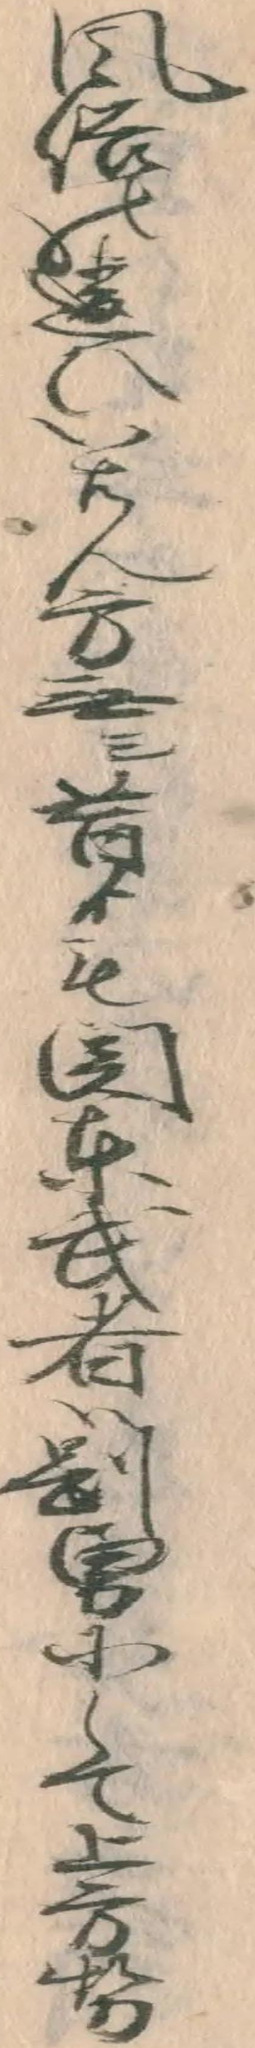風俗の違ひいはん方無し昔よりも関東武者は剛勇にして上方勢
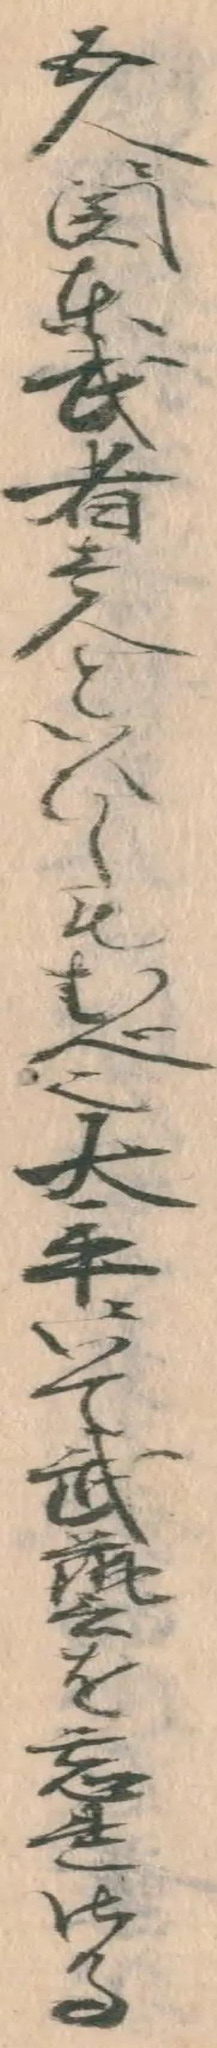五人に関東武者壱人といひしもむべ也大平にいて武芸を忘れさる
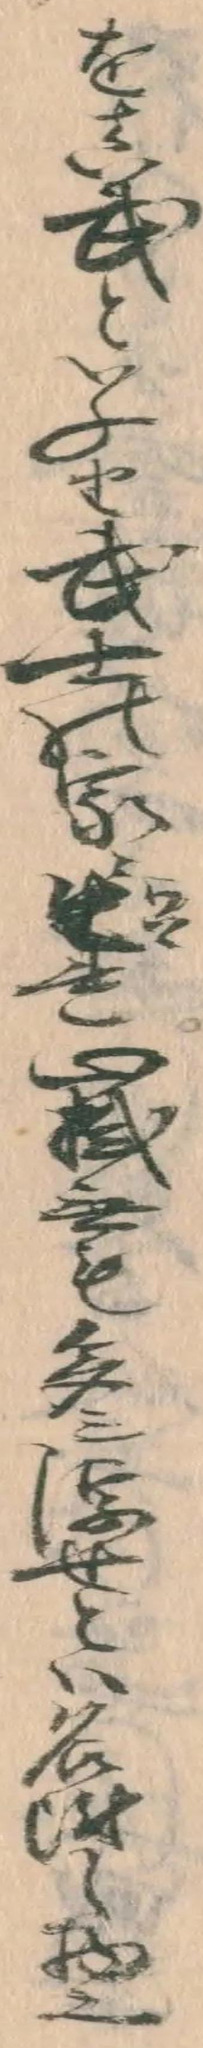を真武といふ由武士の家に生れ心掛無も多し浮世とは名附し物也
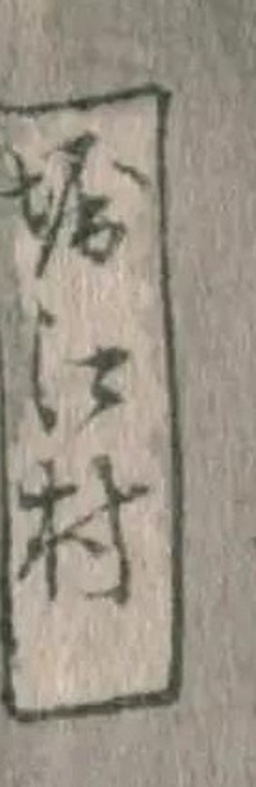堀江村
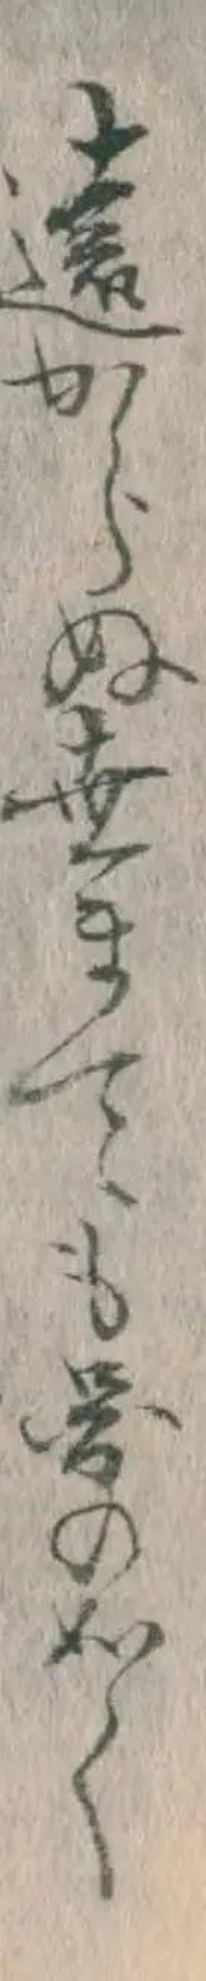遠からぬ世まても図の如く
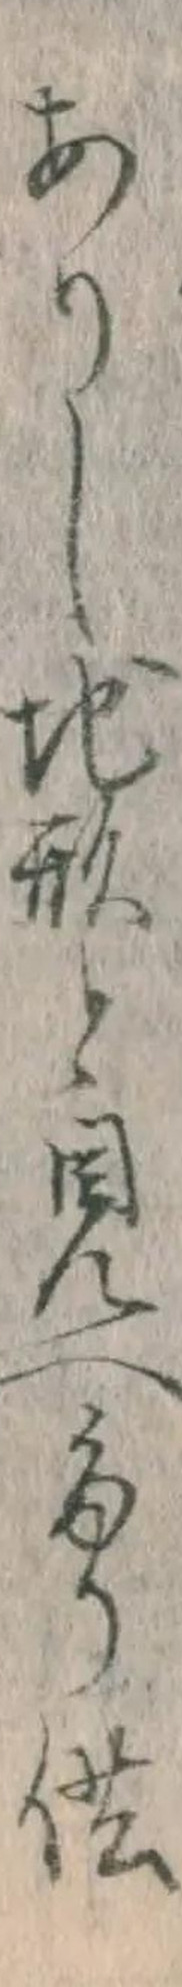ありし地形と見へたり供
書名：四神地名録 6巻. [4]葛飾郡
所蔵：国立国会図書館 National Diet Library, JAPAN
